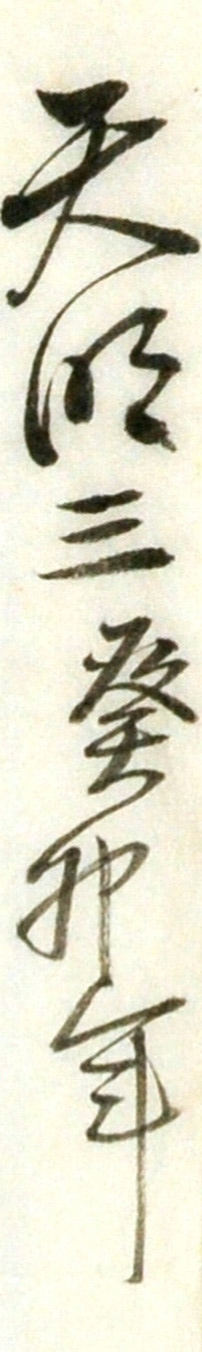天明三癸卯年
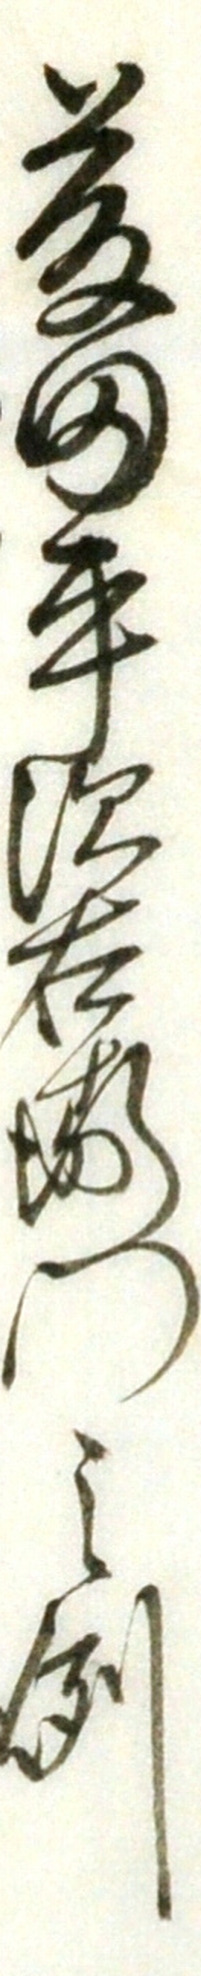藤田平次右衞門之例
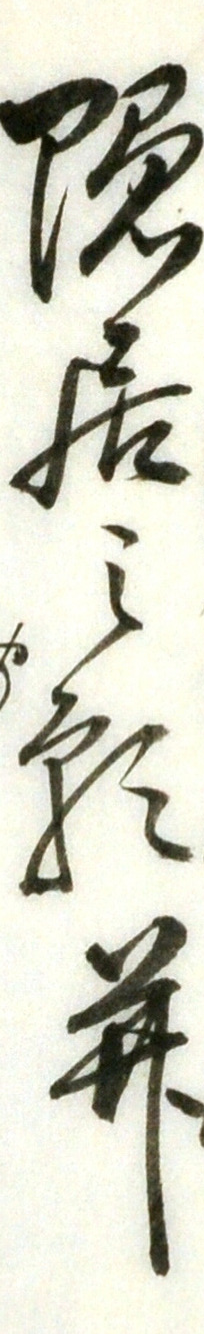隠居之願并
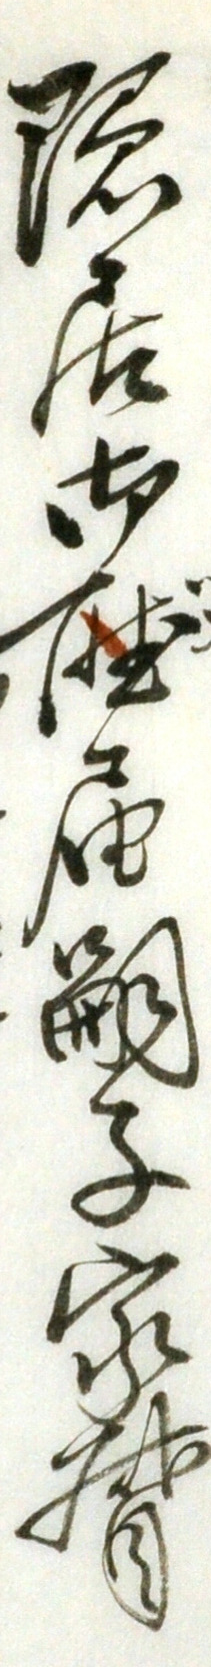隠居御届嗣子家督
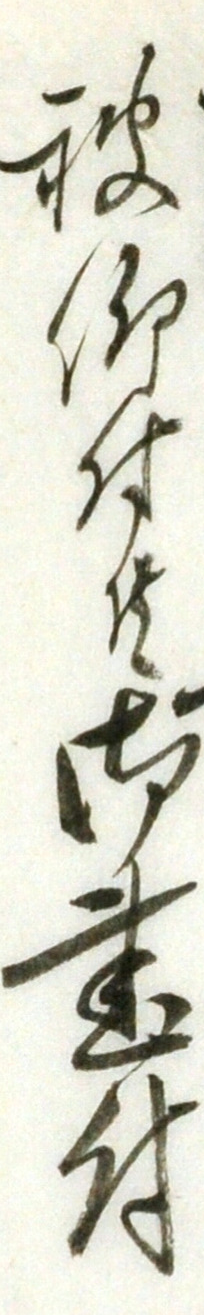被仰付候書付

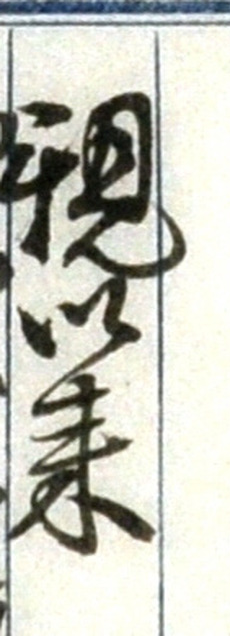親以来
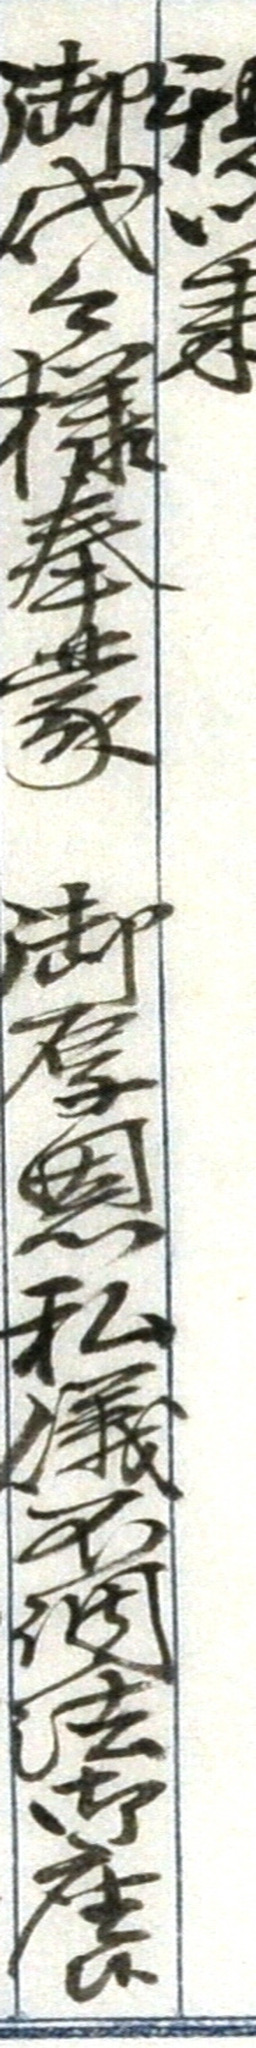御代々様奉蒙御厚恩私儀不調法御座候
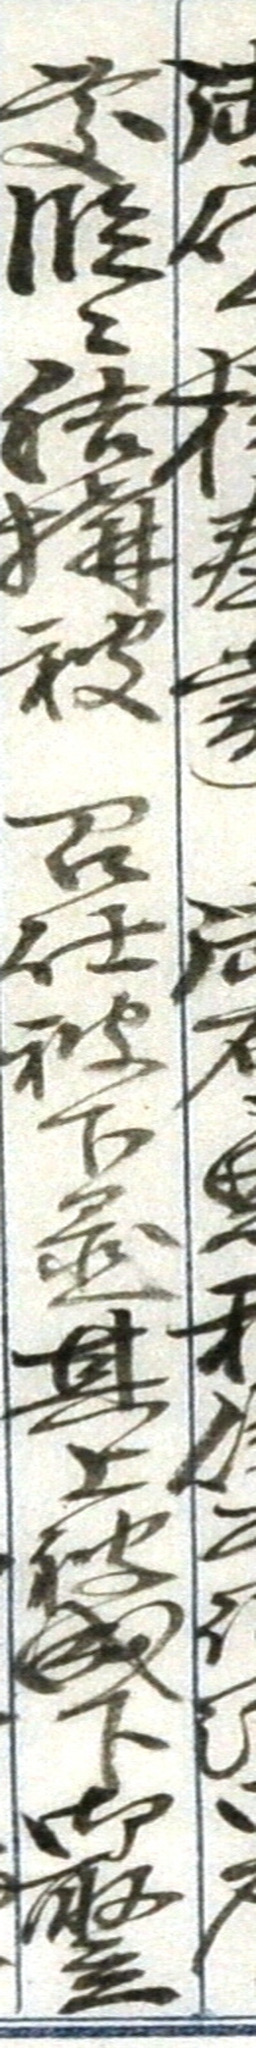処段々結構被召仕被下置其上被成下御取立
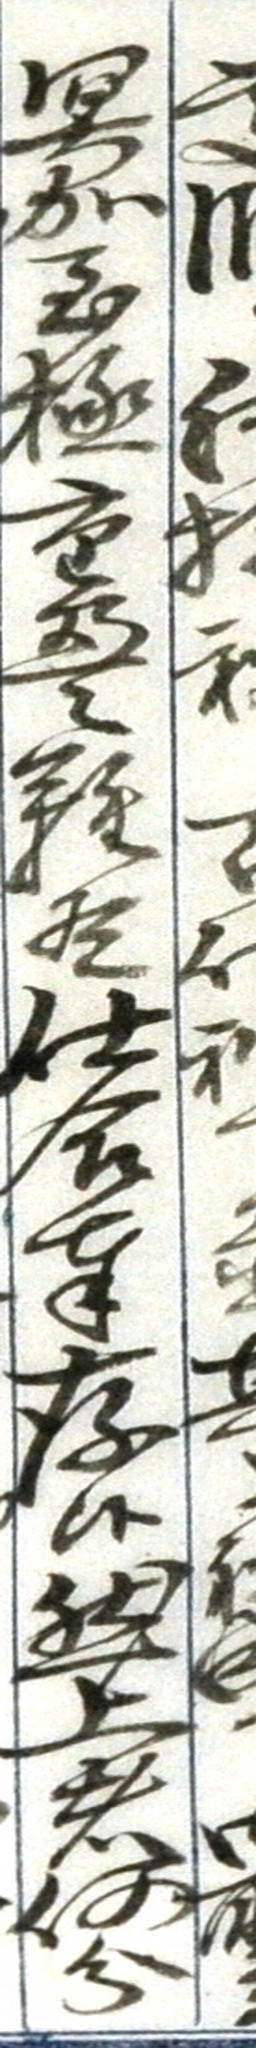冥加至極重畳難有仕合奉存候然上者何分
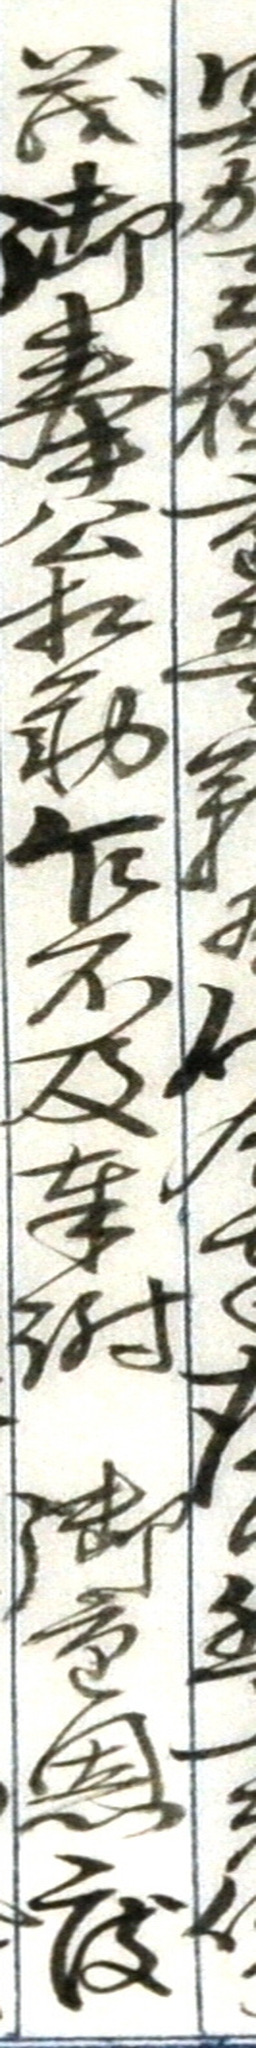茂御奉公相勤乍不及奉附御重恩度
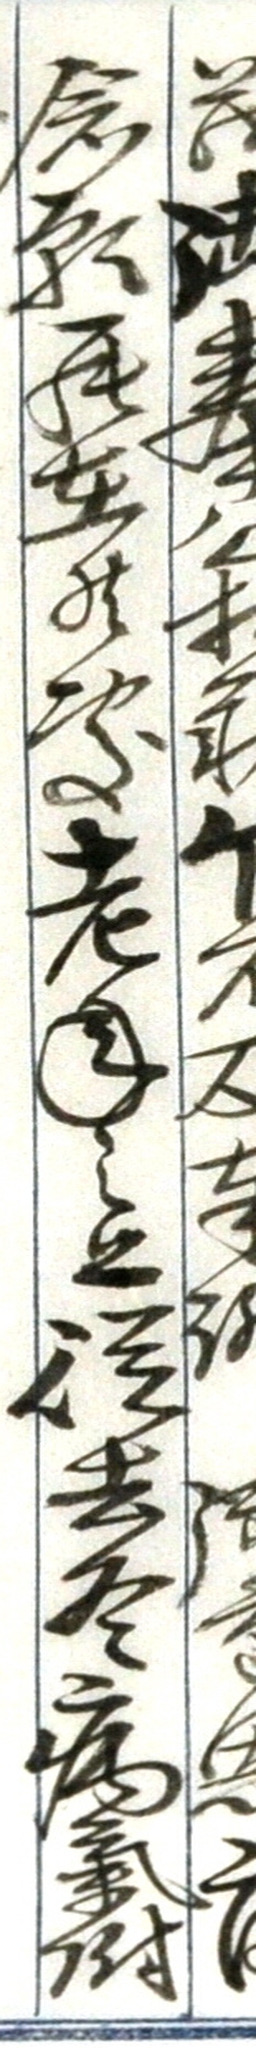念願罷在候処老年之上従去冬病気附
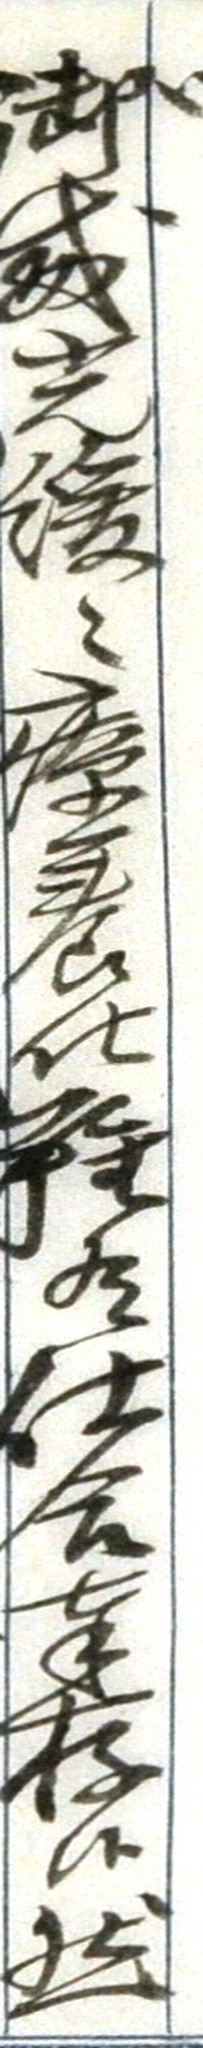御威光緩々療養仕難有仕合奉存候然
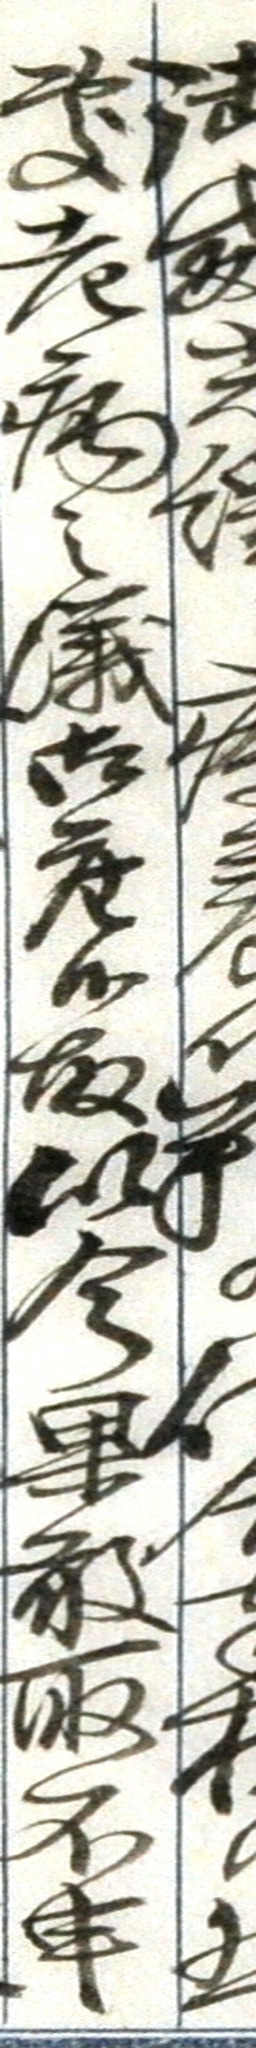処老病之儀御座候故以今果敢取不申
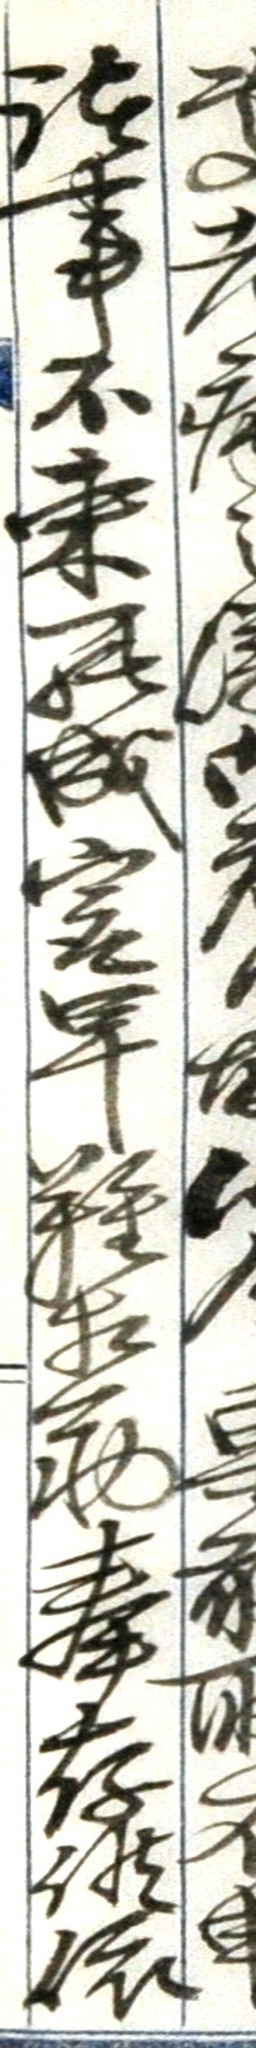諸事不束罷成最早難相勤奉存候依

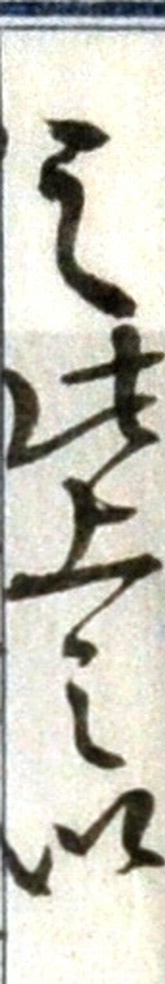之此上之以
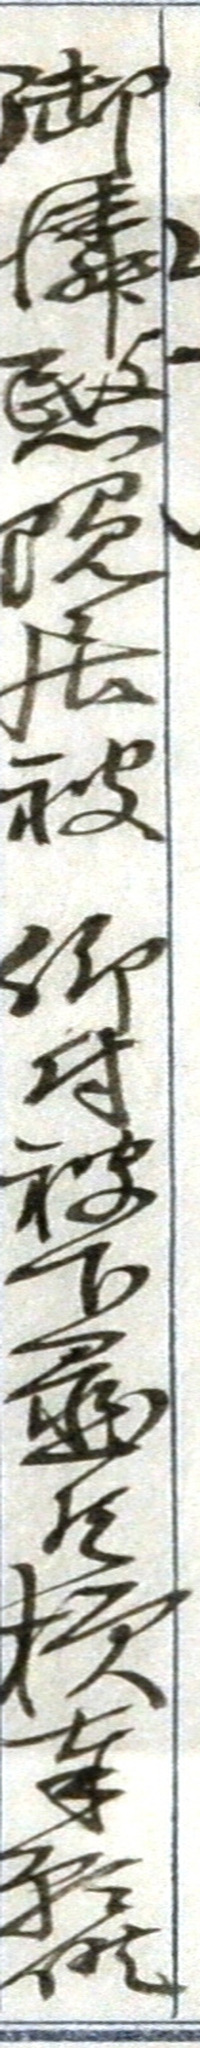御憐憫隠居被仰付被下置候様奉願候
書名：隠居之願并隠居御聞届嗣子家督被仰付候御書付
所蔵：伊那市立高遠町図書館・合同会社AMANE
